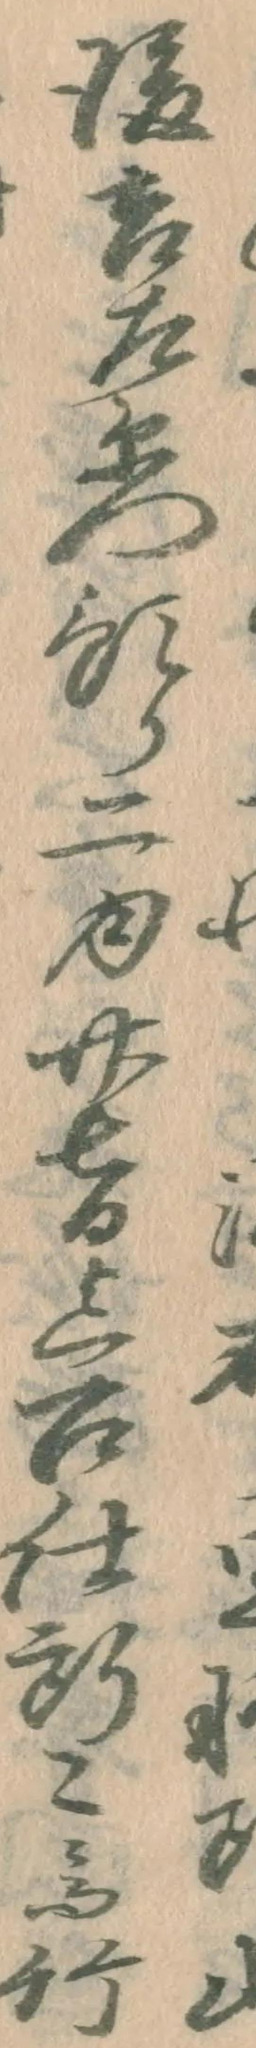後音左衛門預り二月廿七日迄召仕所々に而竹
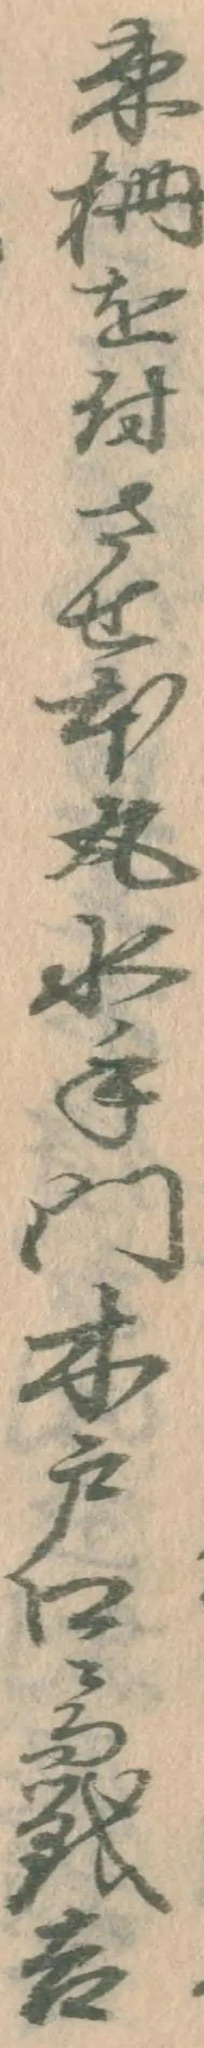束柵を付させ本丸水手門木戸口に而戦吉
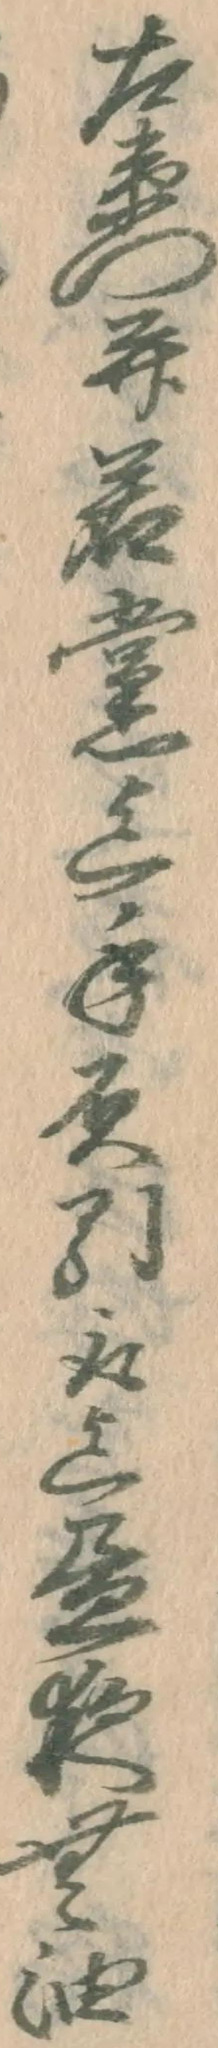左衛門幷若党迄手負引取迄昼夜無油
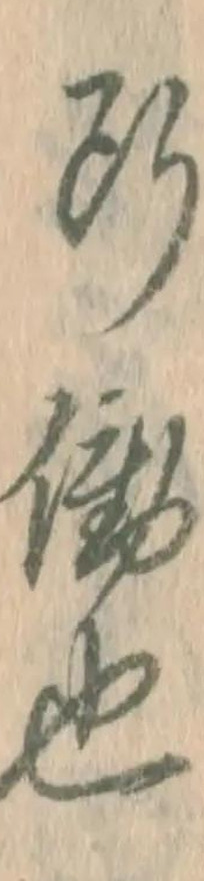断働也
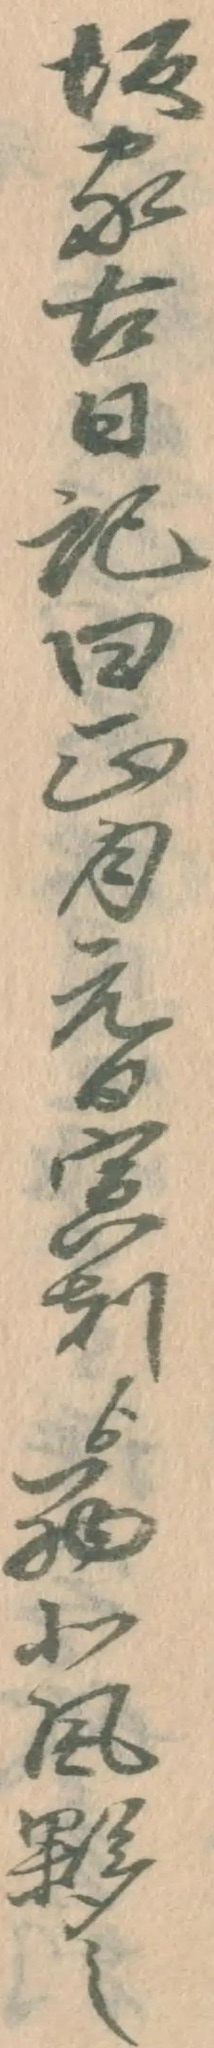坂家古日記曰正月元日寅刻ゟ西北風夥し

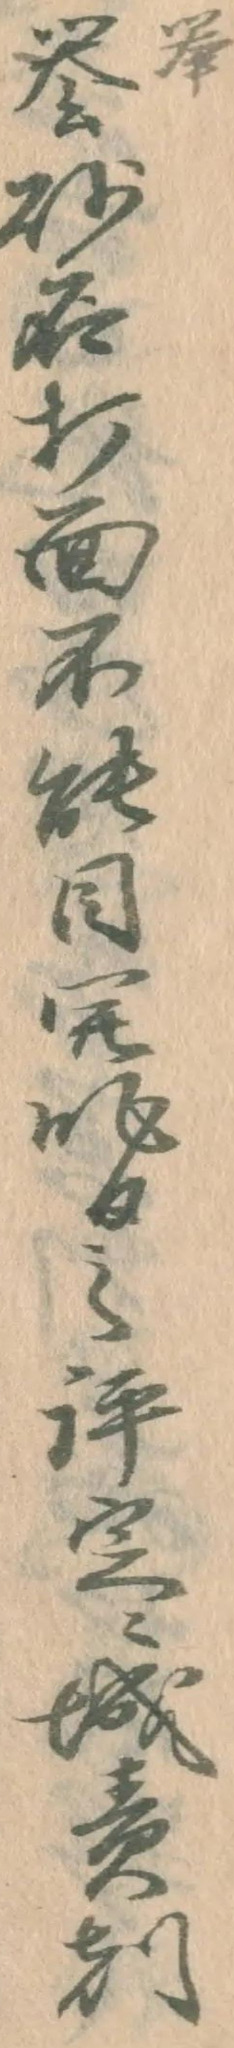挙砂石打面不能目開昨日之評定に城責刻
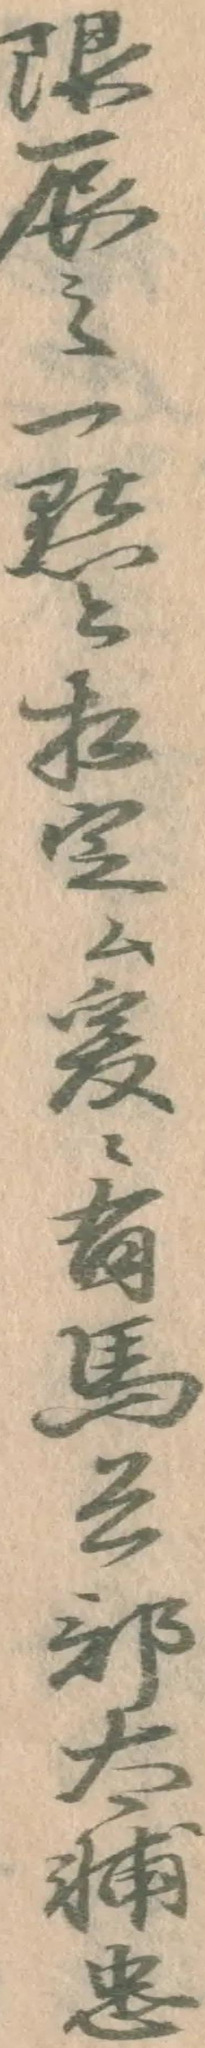限辰之一點と相定む爰に有馬兵部太輔忠
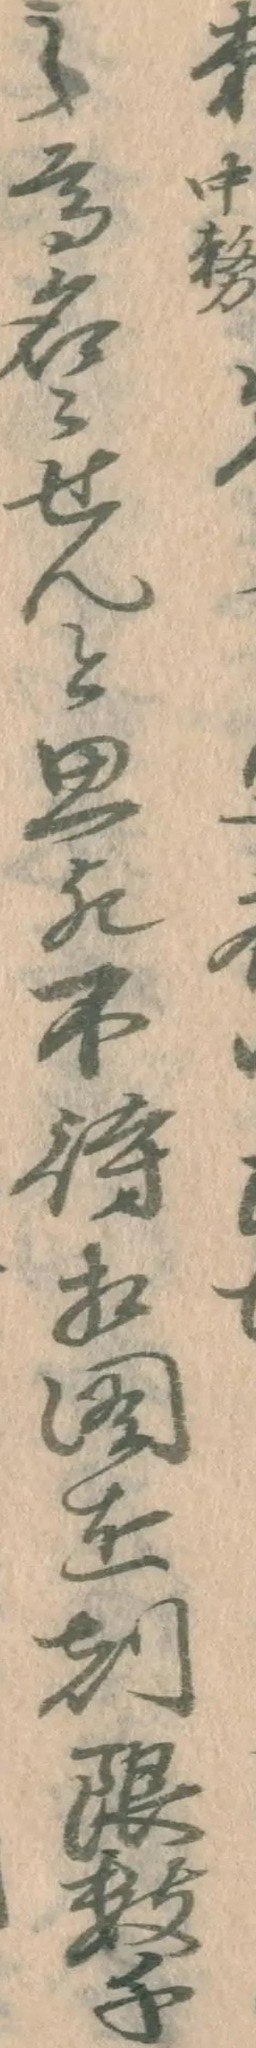之高名にせんと思歟不待相図を刻限数千
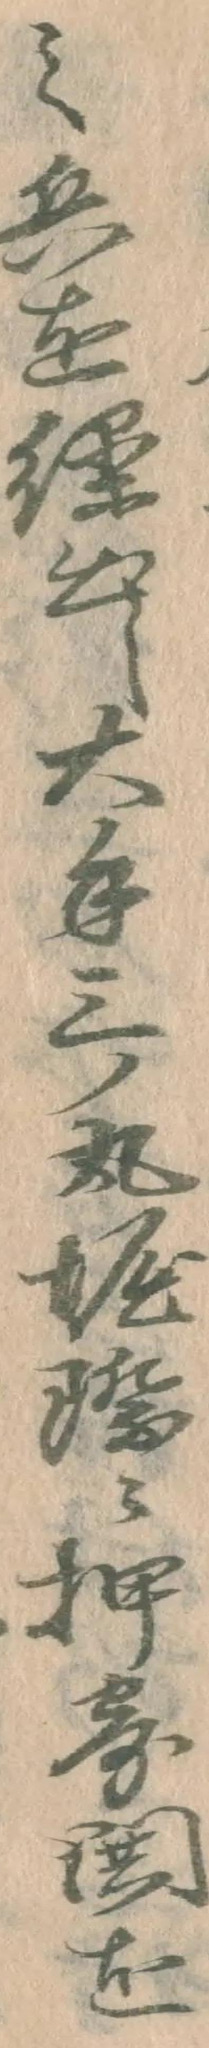之兵を繰出し大手三之丸堀際に押寄鬨を
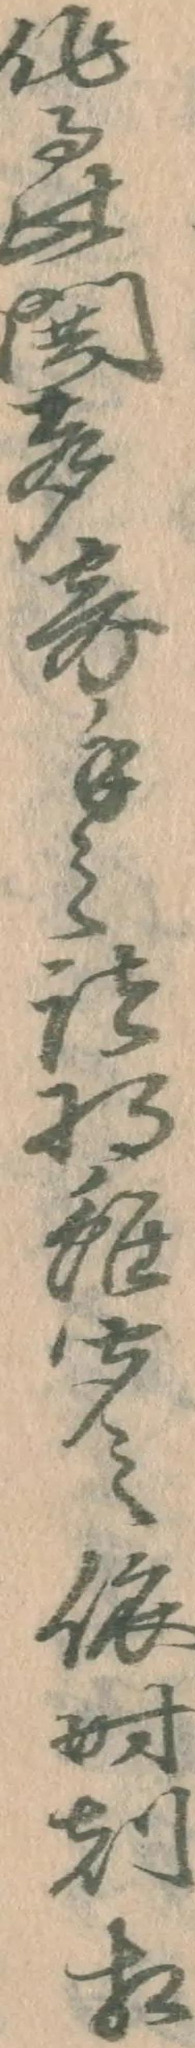作る此鬨声寄手之諸将雖聞之依時刻相
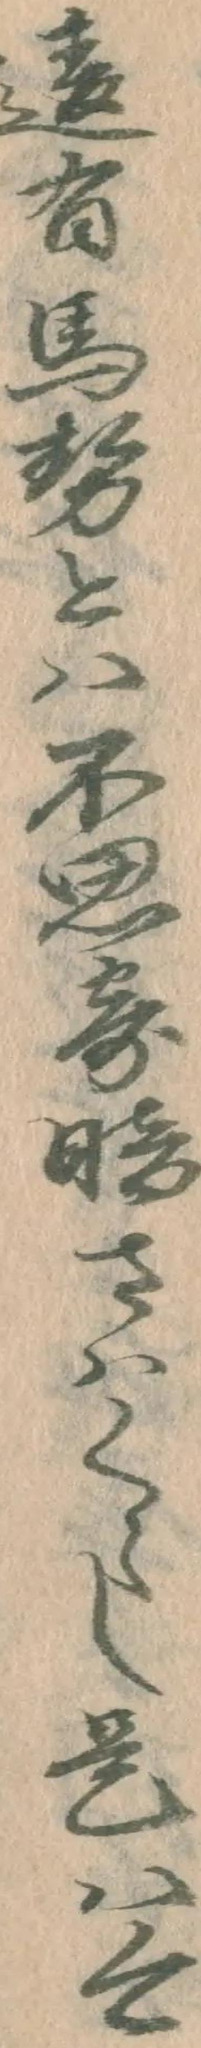違有馬勢とは不思寄暗さはくらし是は今
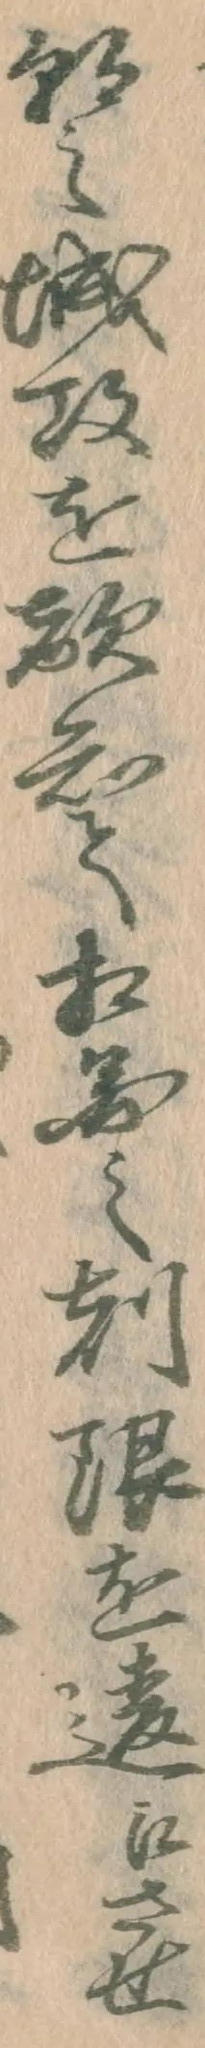朝之城攻を敵知て相図之刻限を違江させ
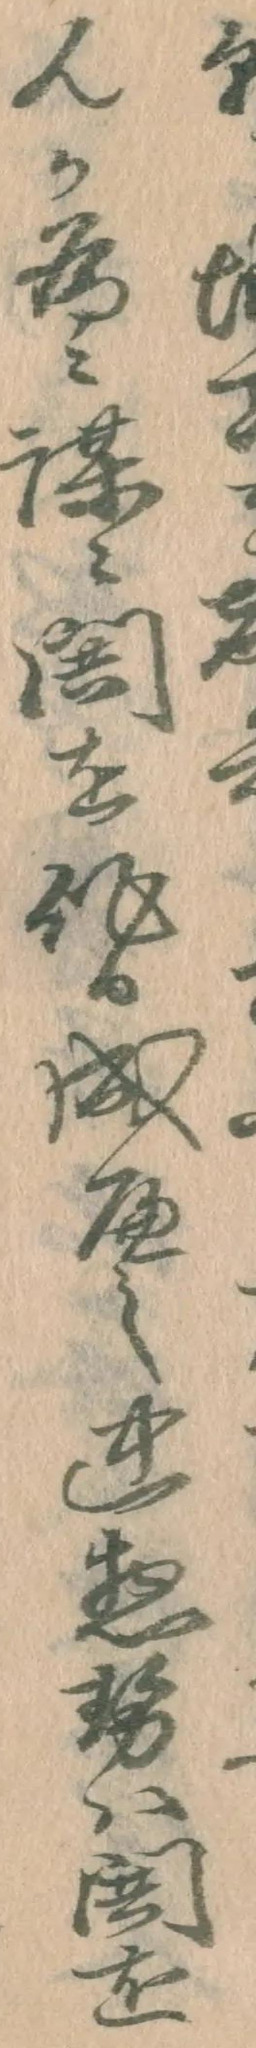んか為に謀に鬨を作る成扁し迚惣勢は鬨を
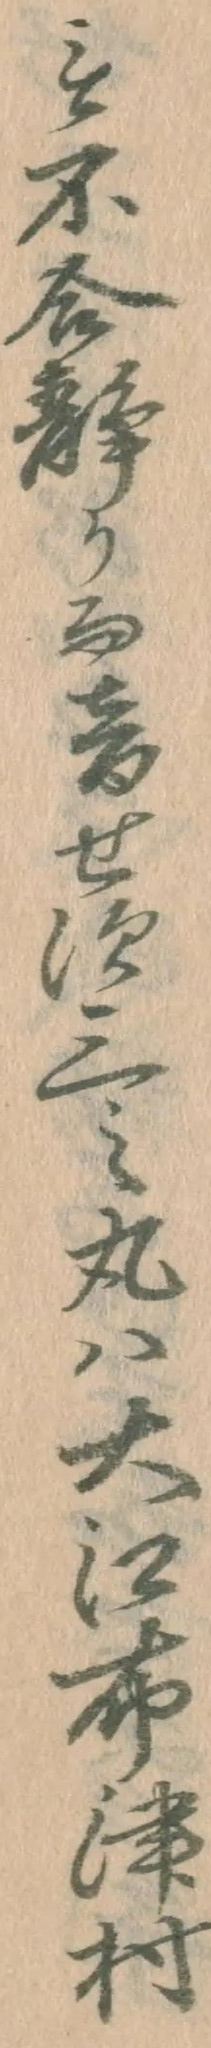も不合静り而音せ須三之丸は大江布津村
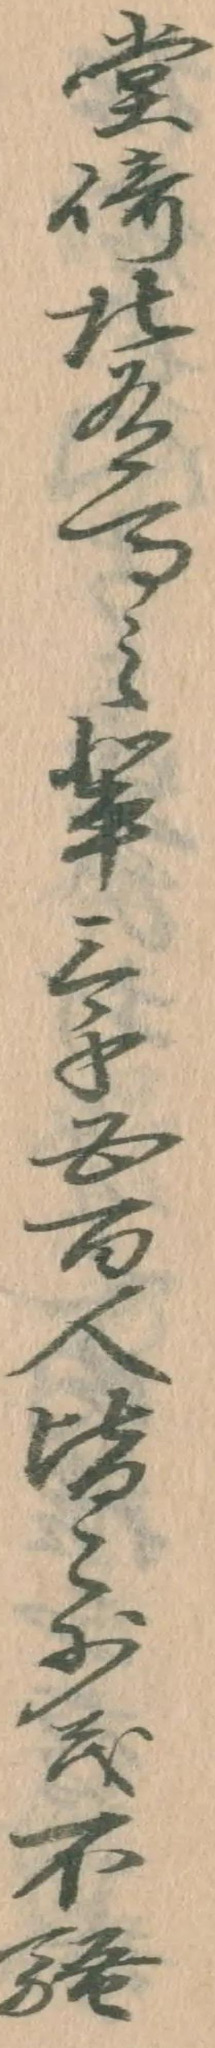堂崎北有馬之輩三千五百人皆々少茂不騒
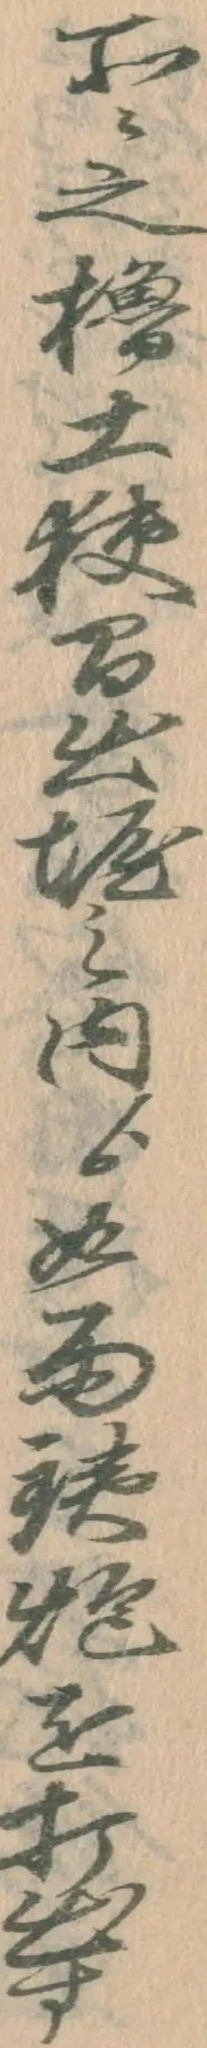所に之櫓土狭間出堀之内ゟ如雨鉄炮打出す
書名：切支丹御退治記 49巻. [5]
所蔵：国立国会図書館 National Diet Library, JAPAN
